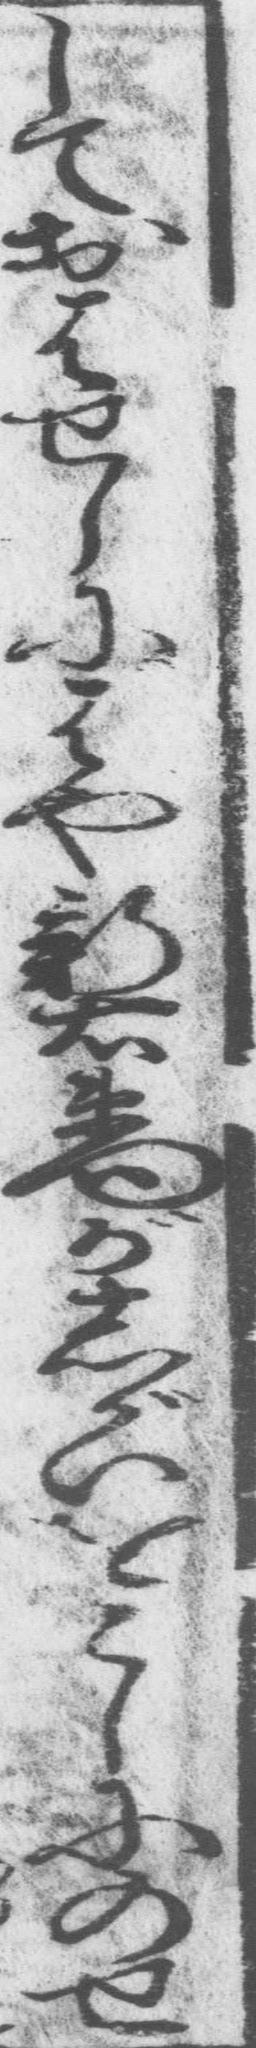しておはせしにはや新右衛がしがいをこしにのせ
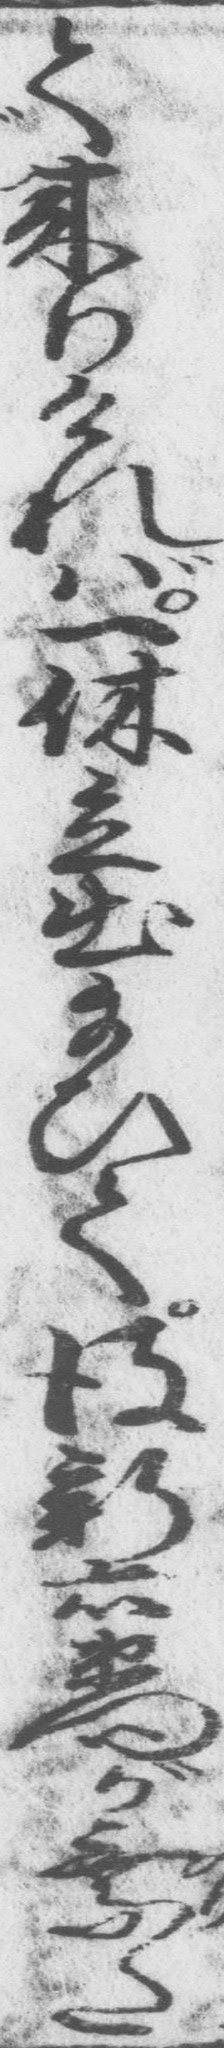て来りければ。一休立出給ひて。彼新右衛が乗た
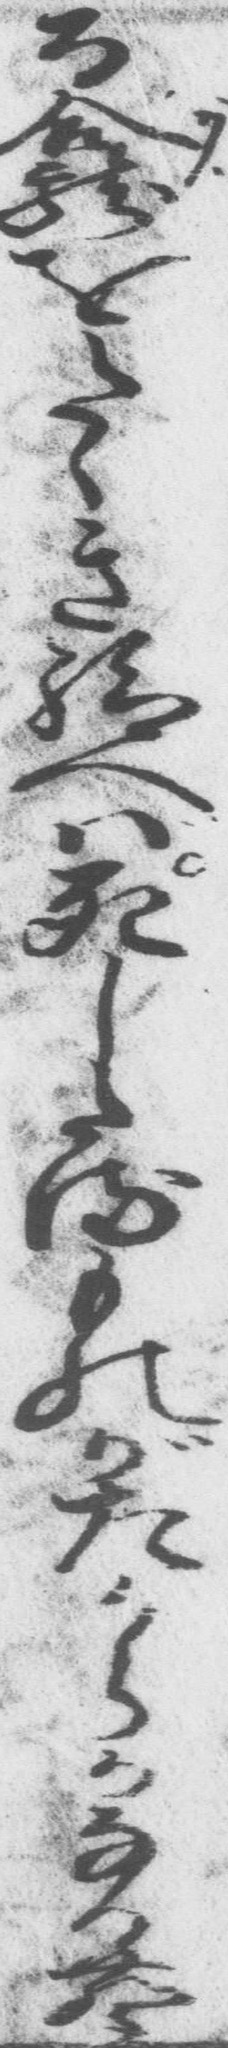る龕をたゝき給へは。死したるものがたからかなる声
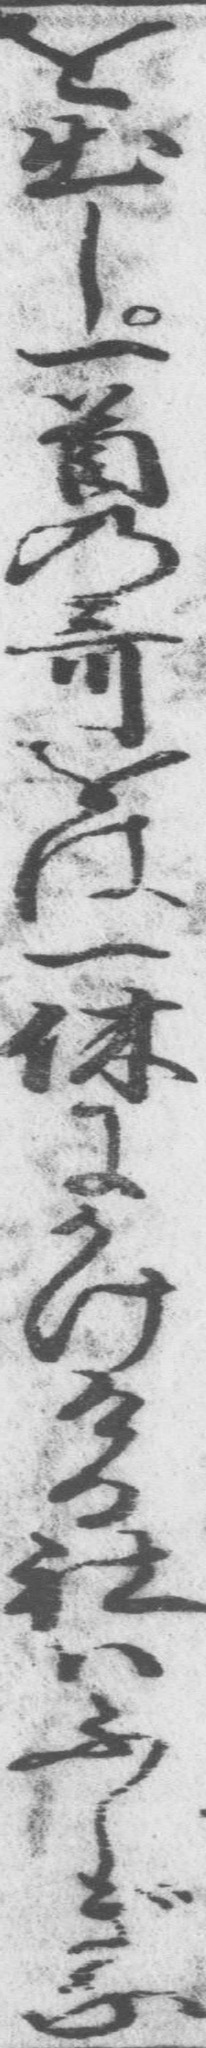を出し。一首の哥をは一休にかける社はふしぎな
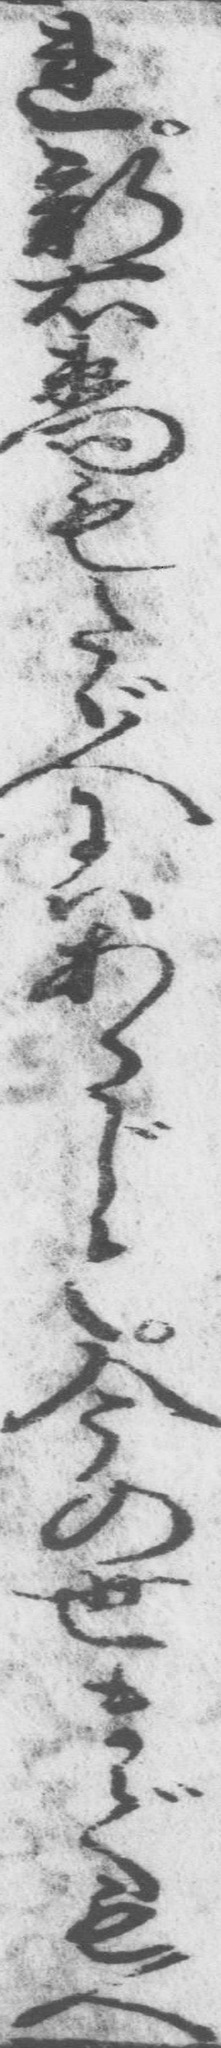れ新右衛門もたゞ人にはあらじと。今の世までも人
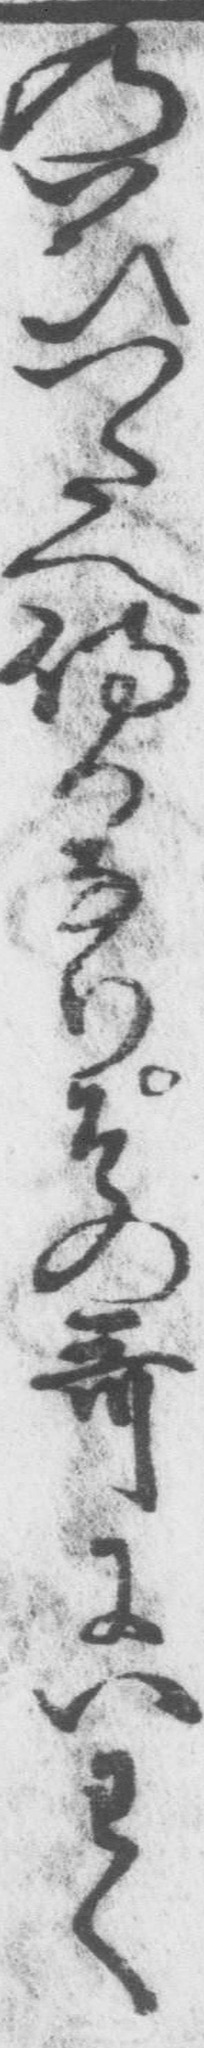のいひつたへ侍るなり。その哥にいわく
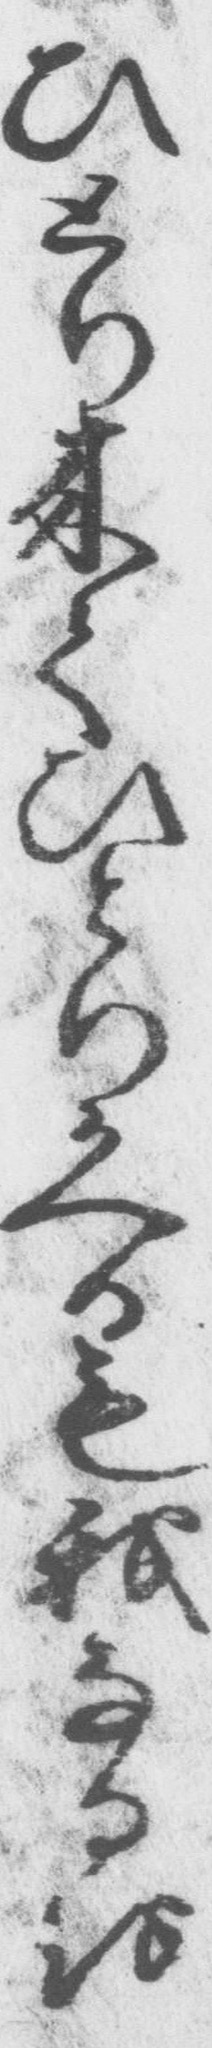ひとり来てひとりかへるも我なるを
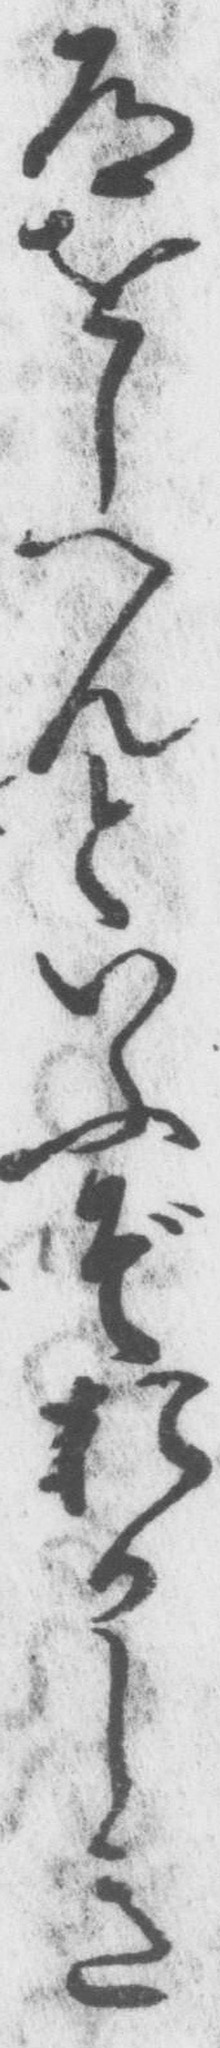道をしへんといふぞおかしき
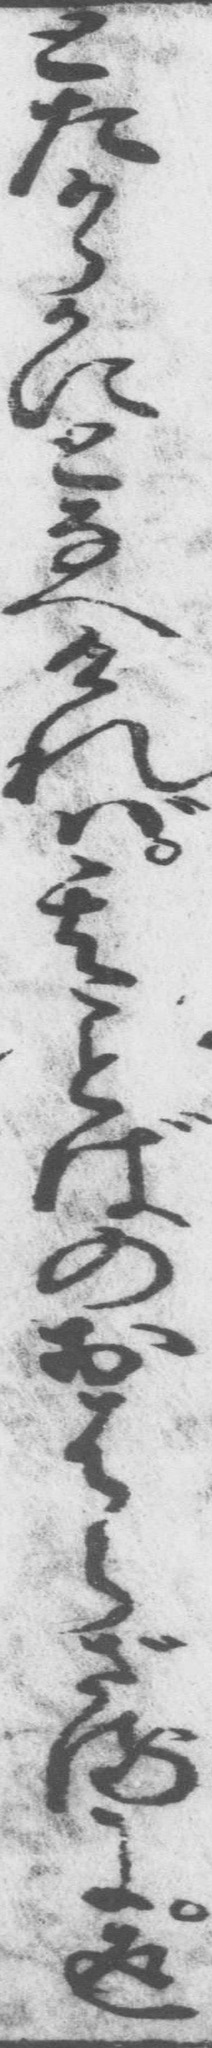とたからかにとなへければ。其ことばのおはらざるに。返
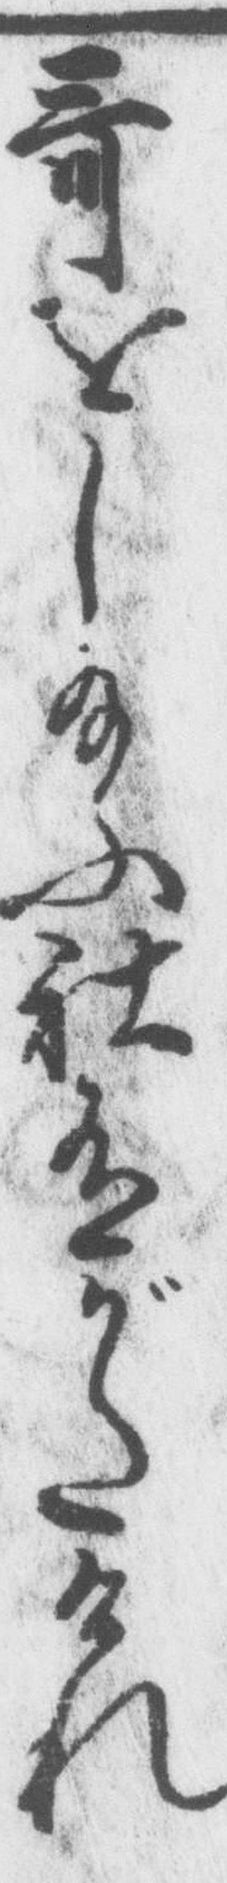哥をし給ふ社有がたけれ
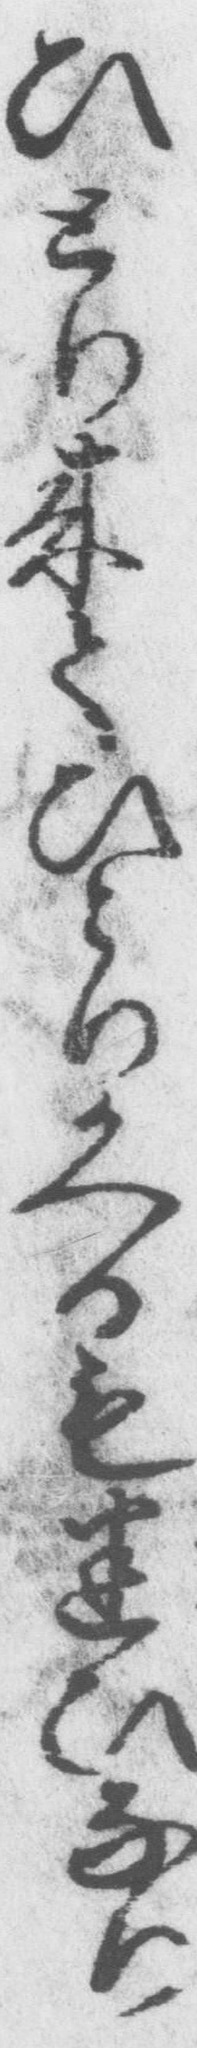ひとり来てひとりかへるも迷ひなり

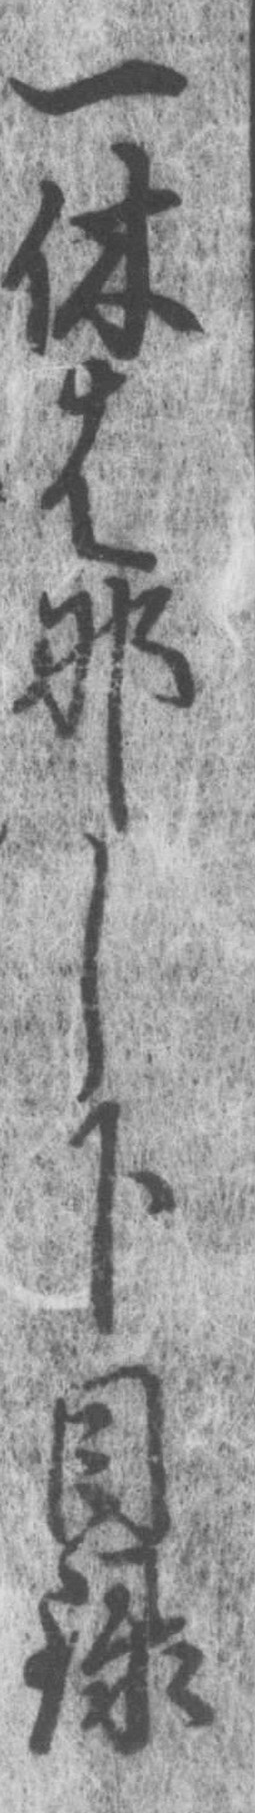一休はなし下目録
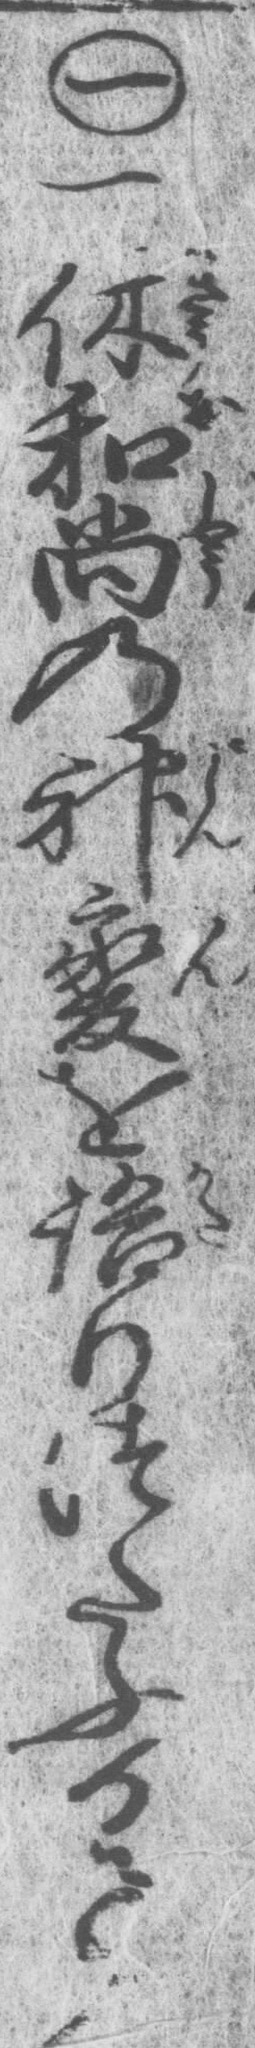一一休和尚の神変を語りつたふる事
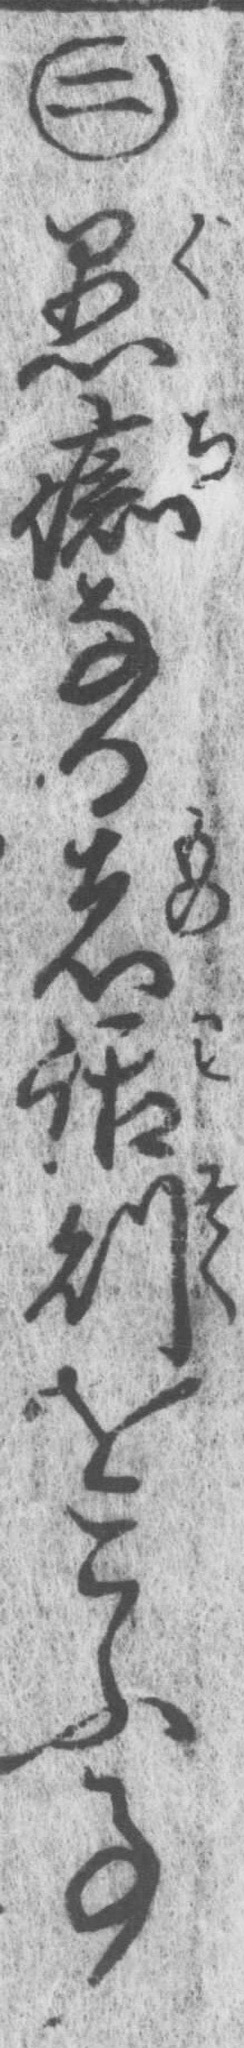二愚痴なる者話則をこふ事
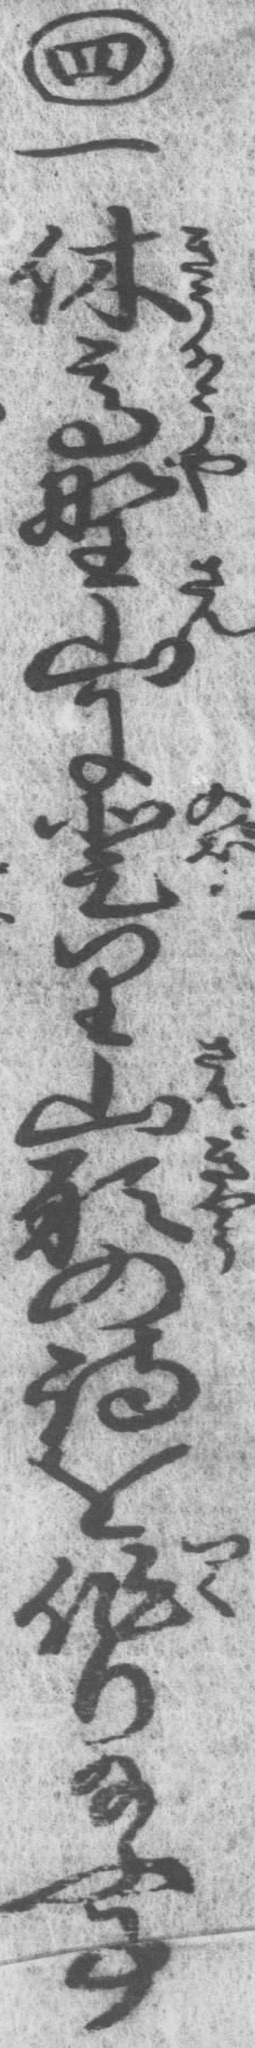四一休高野山に登り山形の詩を作り給ふ事
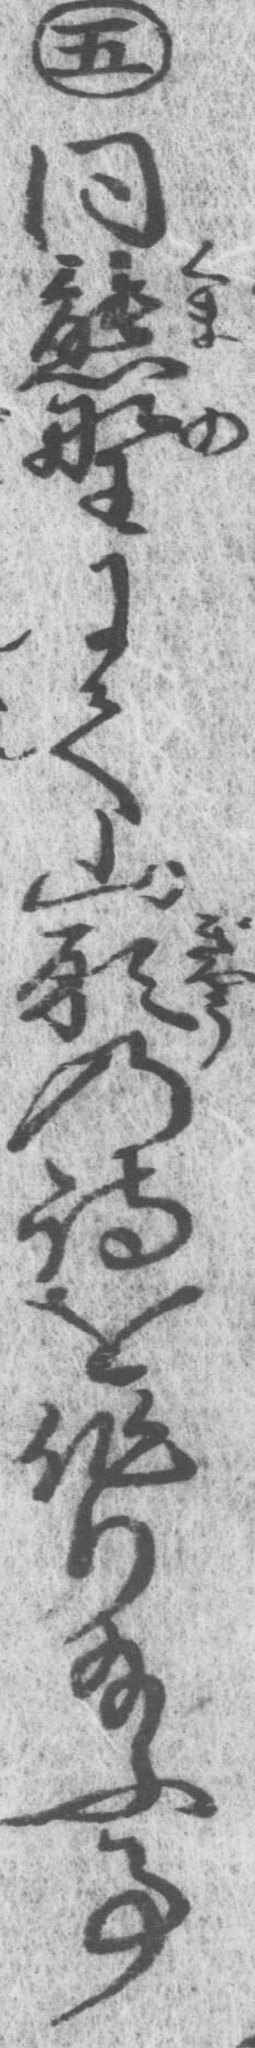五同熊野にて山形の詩を作り給ふ事
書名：一休はなし（元禄十三）
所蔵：大阪公立大学中百舌鳥図書館 国文学研究資料館
